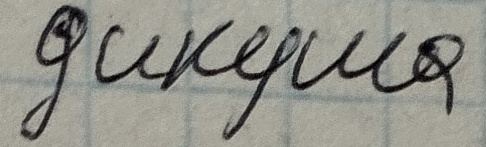дикуша
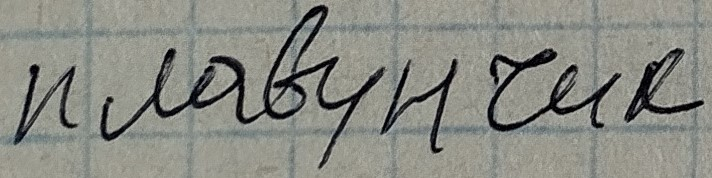плавунчик
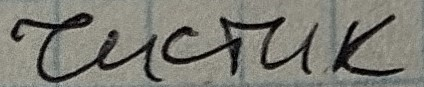чистик
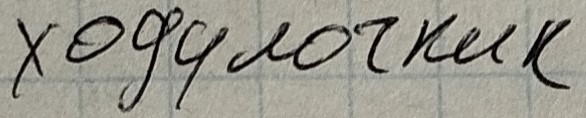ходулочник
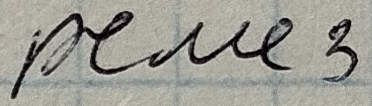ремез
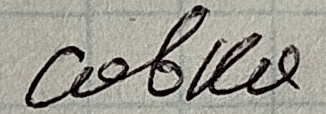совка
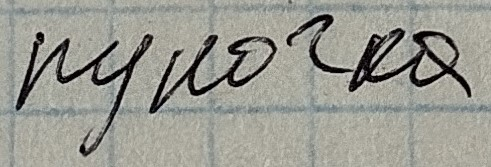пуночка
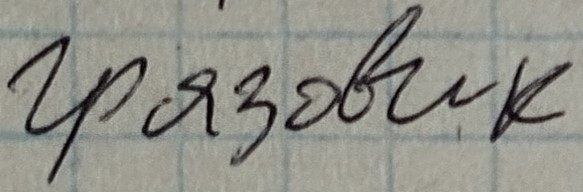грязовик
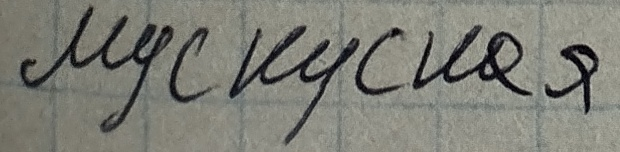мускусная
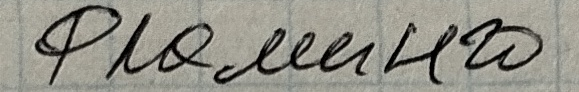фламинго
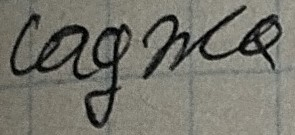саджа
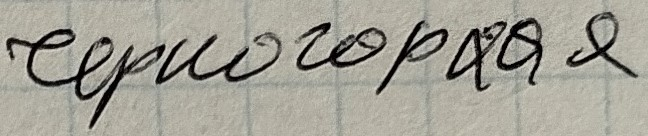черногорлая
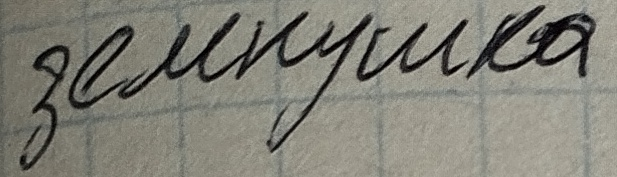земнушка
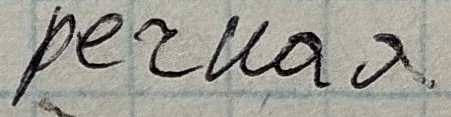речная
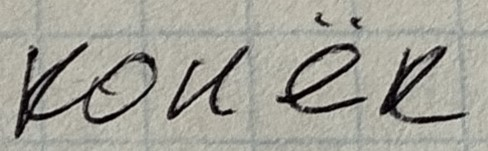конёк
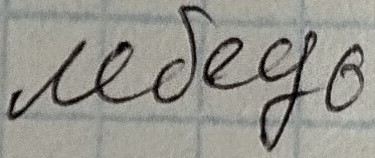лебедь
